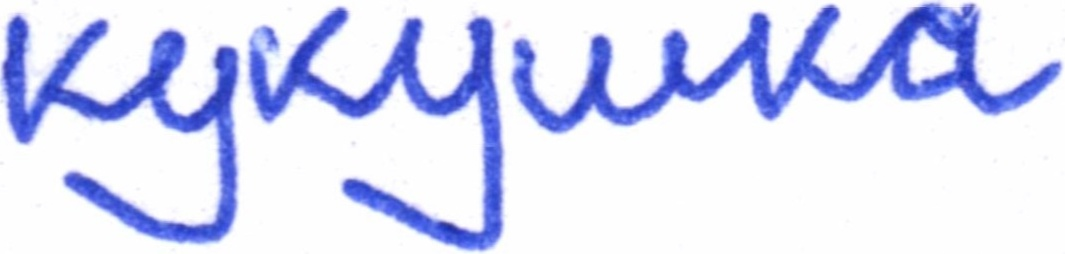кукушка
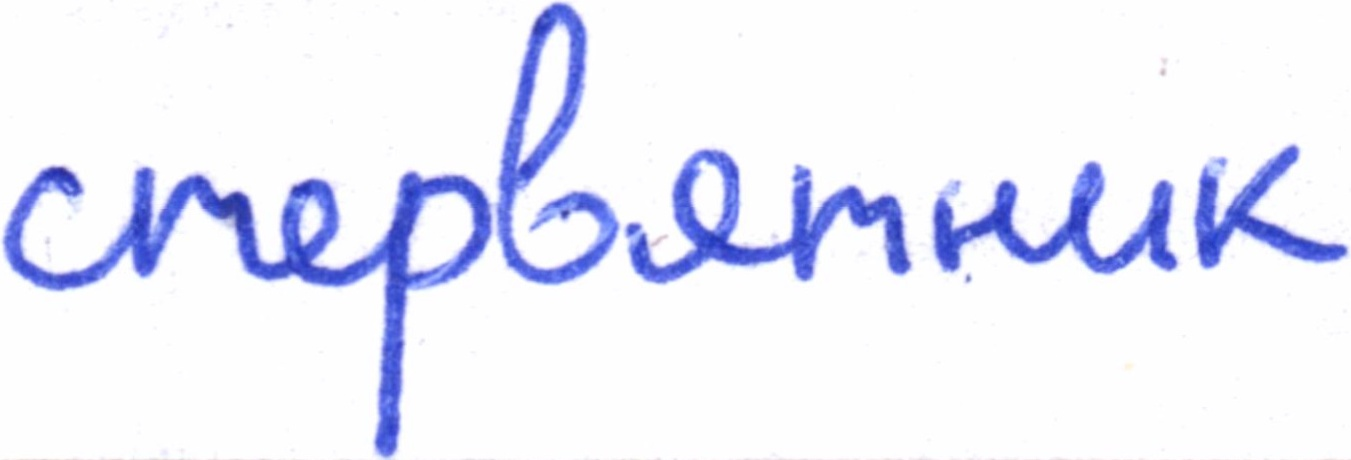стервятник
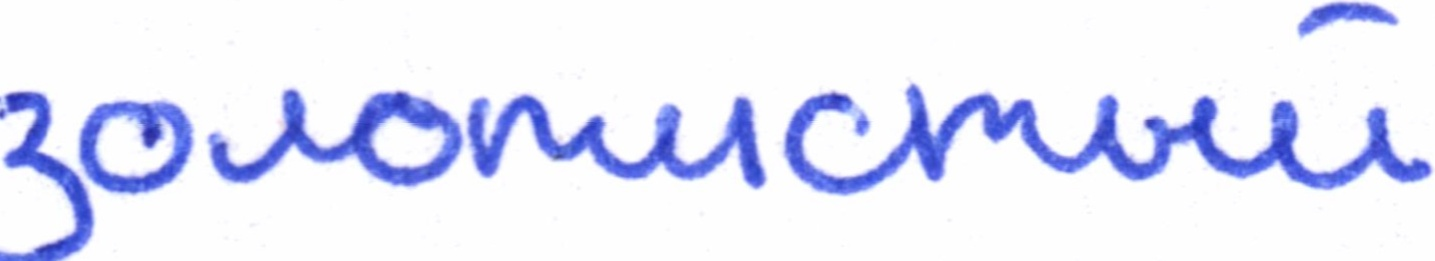золотистый
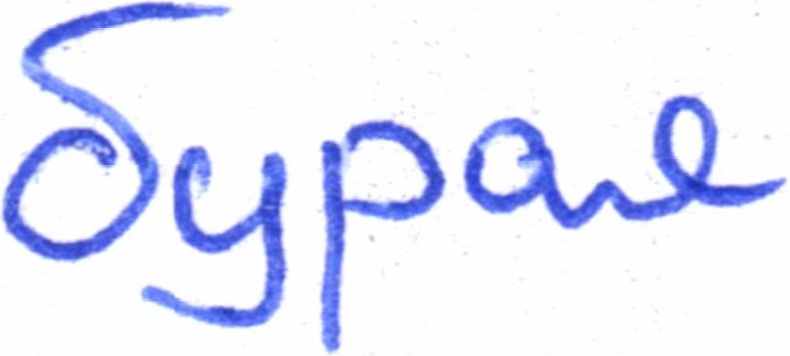бурая
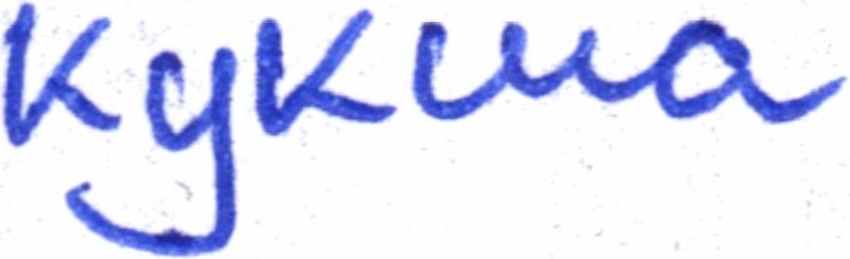кукша
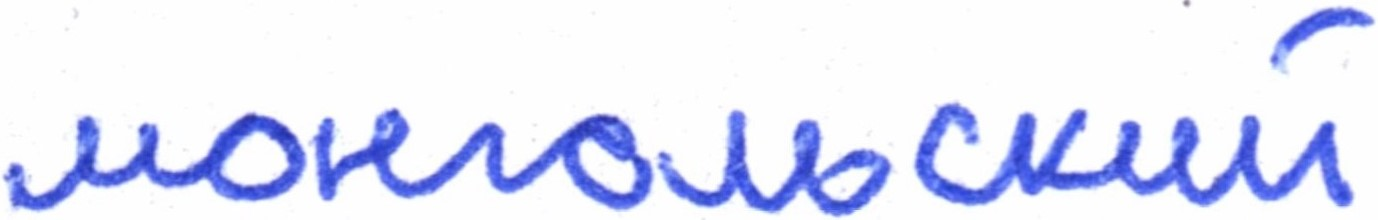монгольский
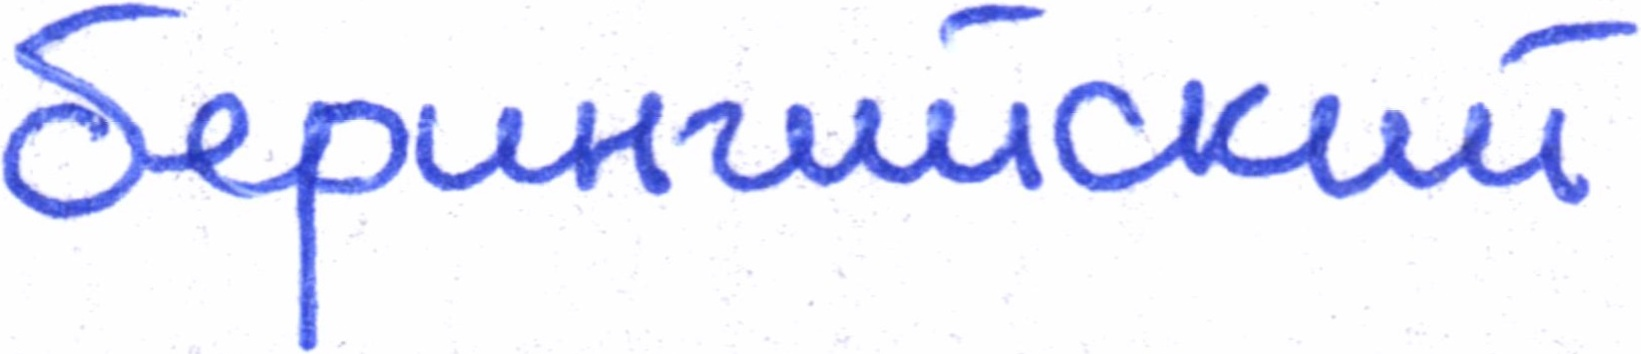берингийский
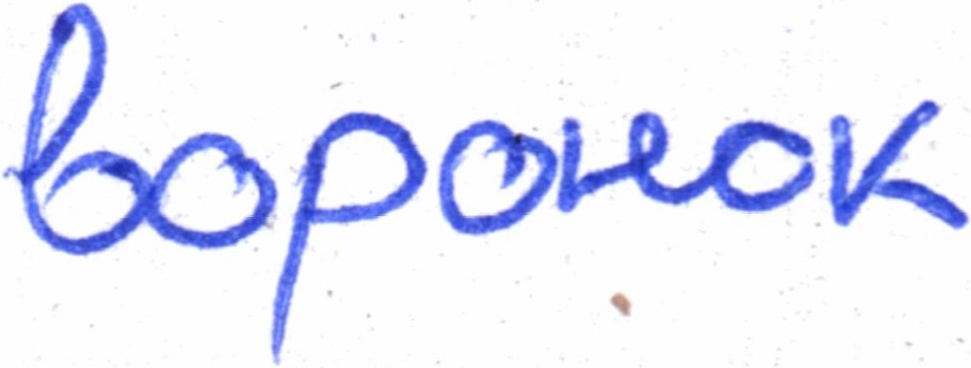воронок
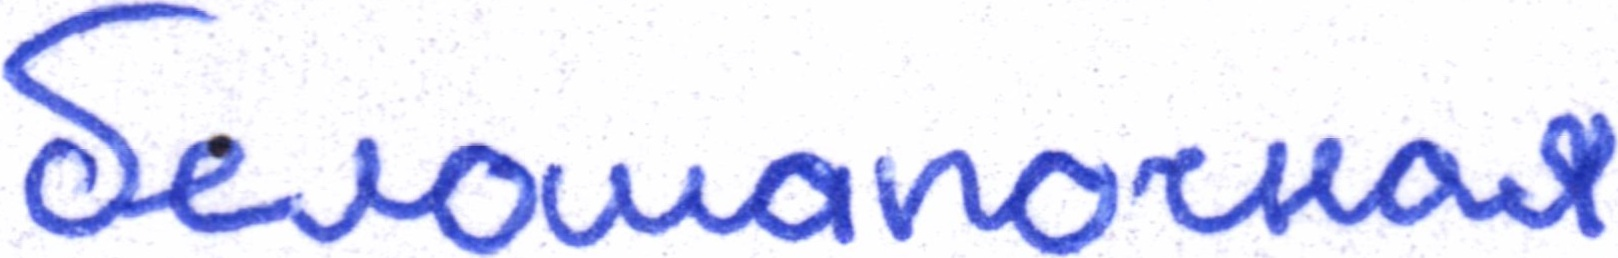белошапочная
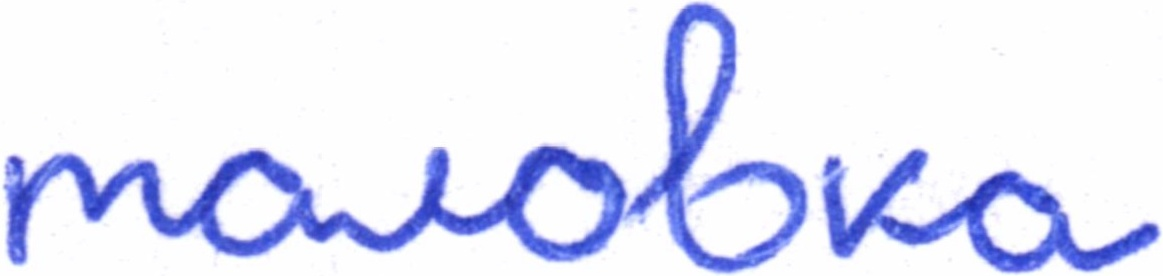таловка
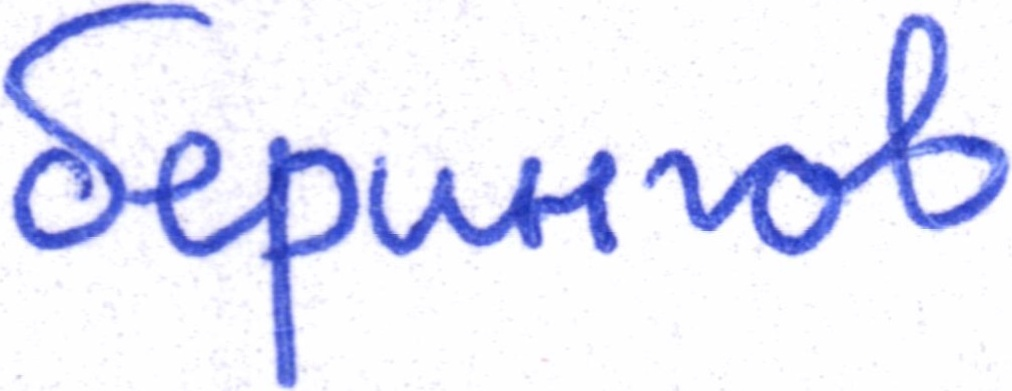берингов
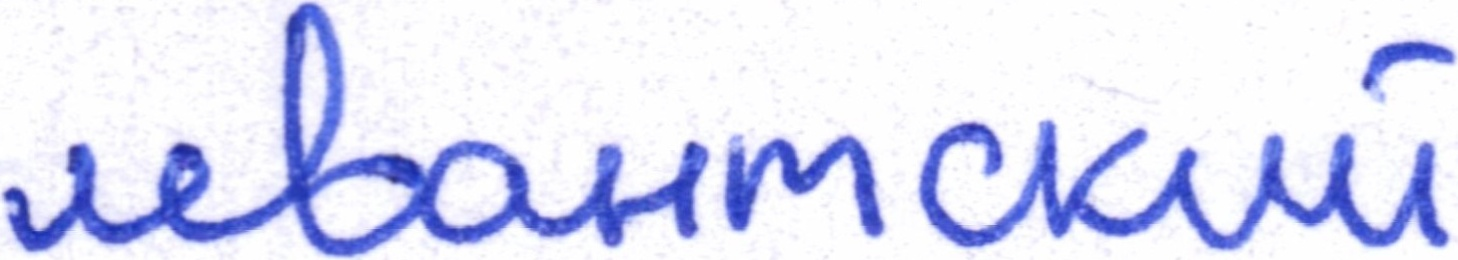левантский
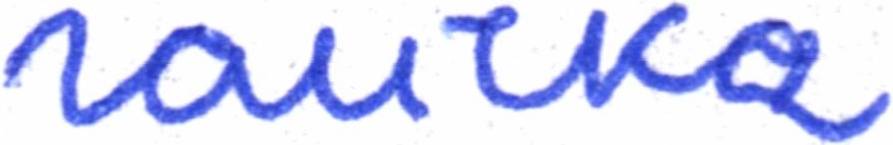гаичка
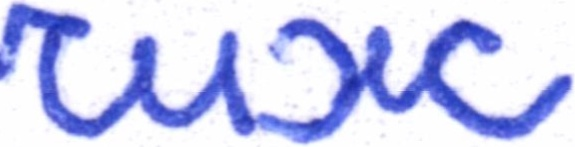чиж
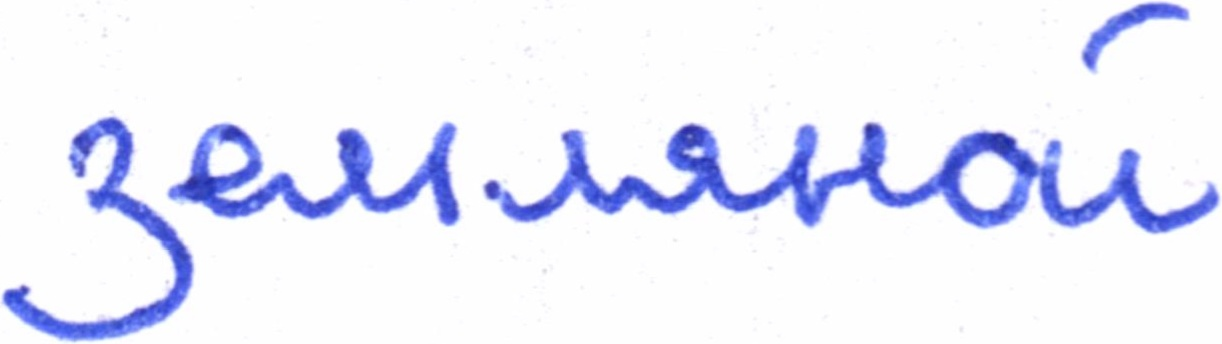земляной
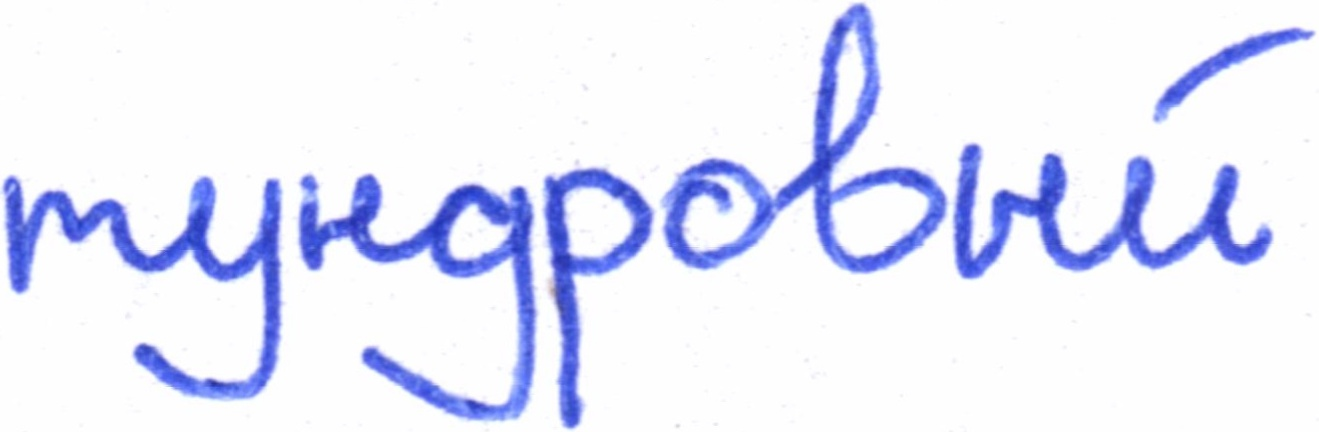тундровый
